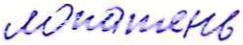лопатень
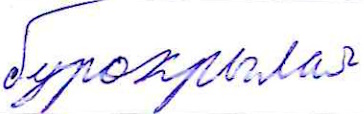бурокрылая
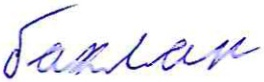баклан
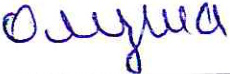олуша
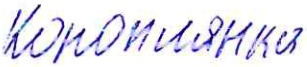коноплянка
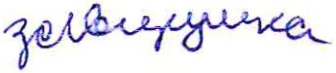завирушка
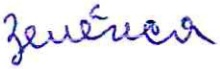зелёная
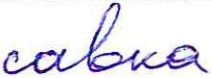савка
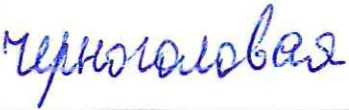черноголовая
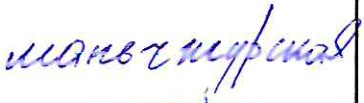маньчжурская
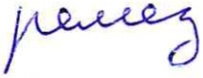ремез
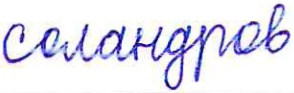соландров
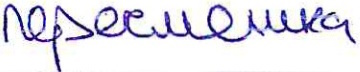пересмешка
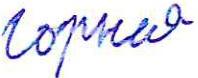горния
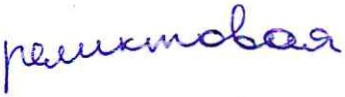реликтовая
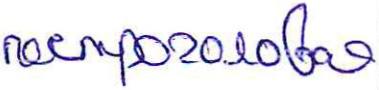пестроголовая
